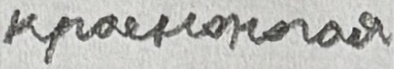красноногая
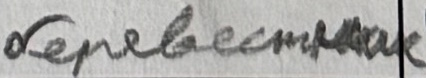беревестник
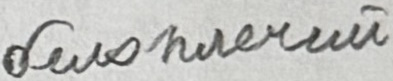белоплечий
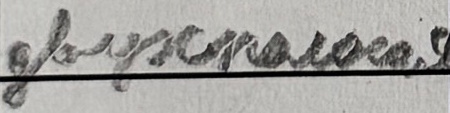двухполосая
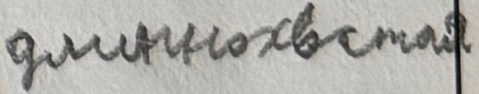длиннохвстая
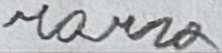чомга
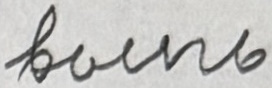выпь
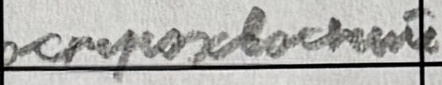острохвостый
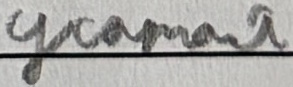усатая
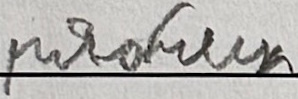рябчик
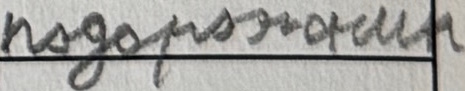подорожник
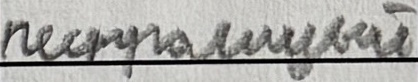пестролицый
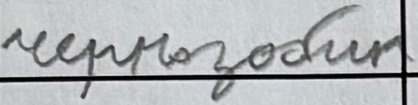чернозобик
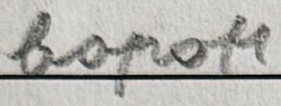ворон
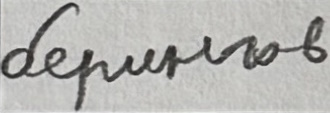берингов
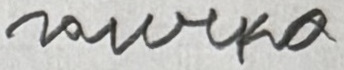гаичка
